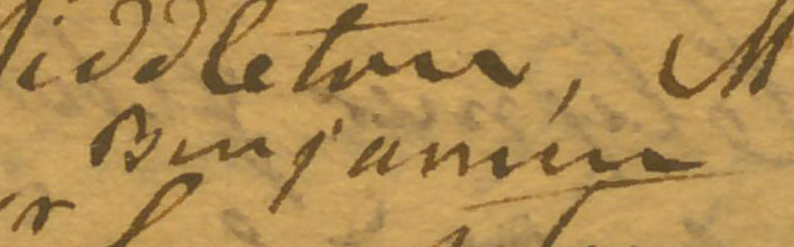Benjamen
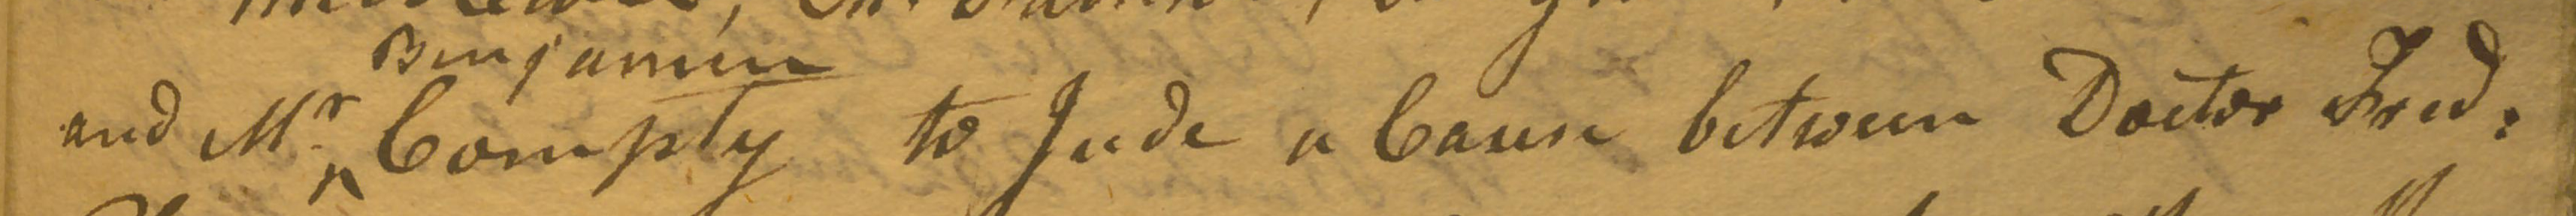and M^r. ^ Compty to Jude a Cause between Doctor Fred:
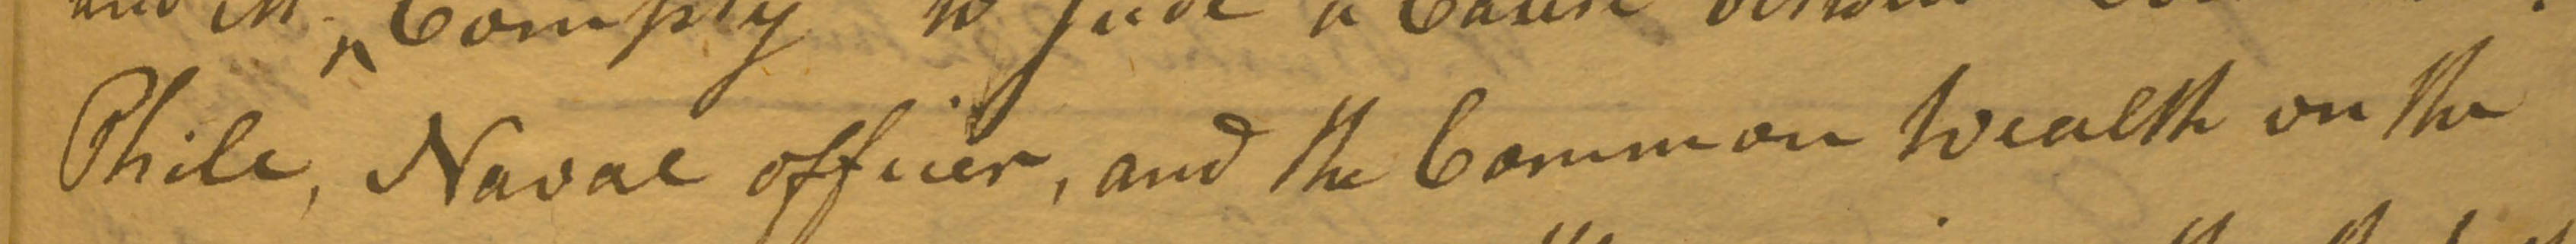Phile, Naval officer, and the Common wealth on the
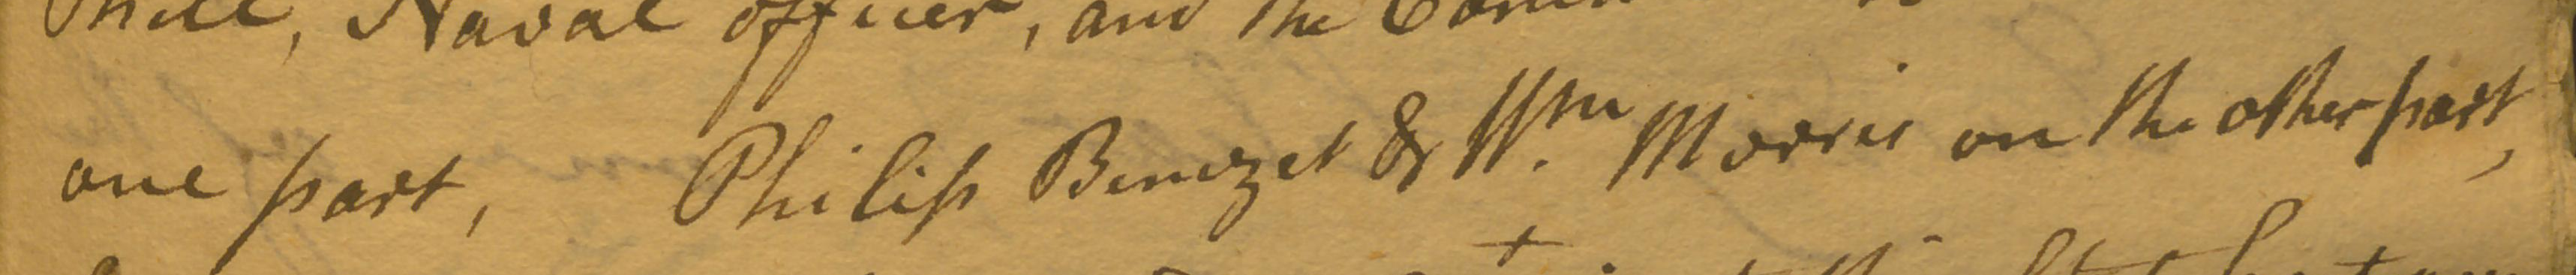one part, Philip Benezet & W^m. Morris on the other part,
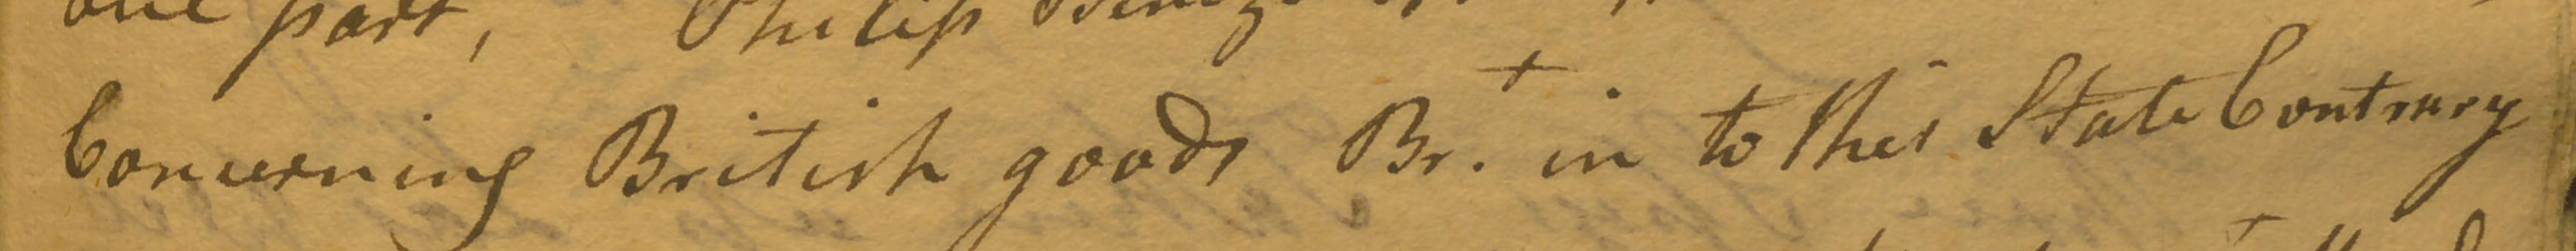Concerning British goods Br^t. in to this State Contrary
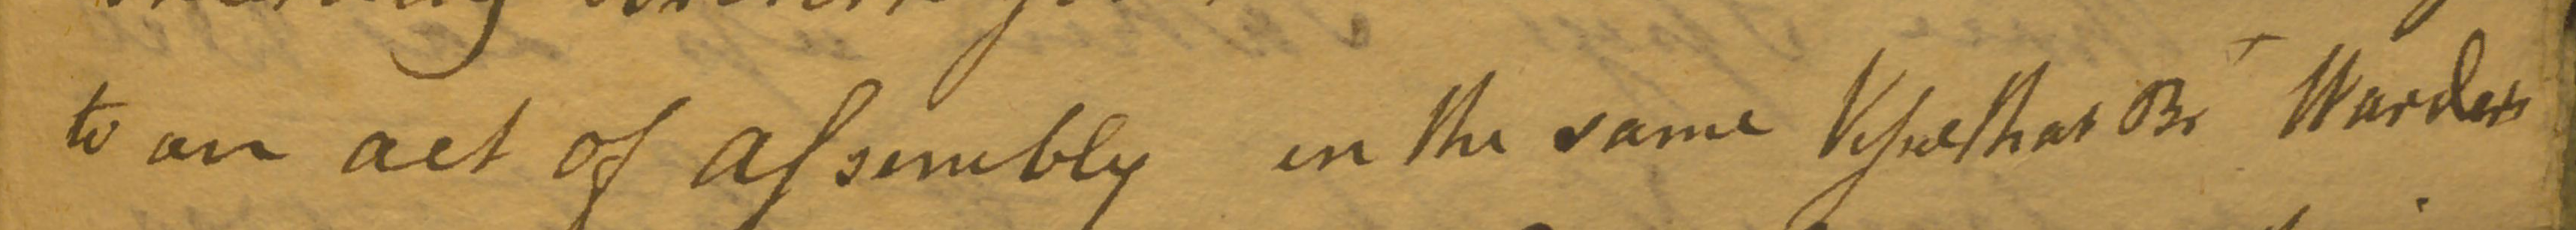to an act of assembly in the same Vessel that Br^t Warders
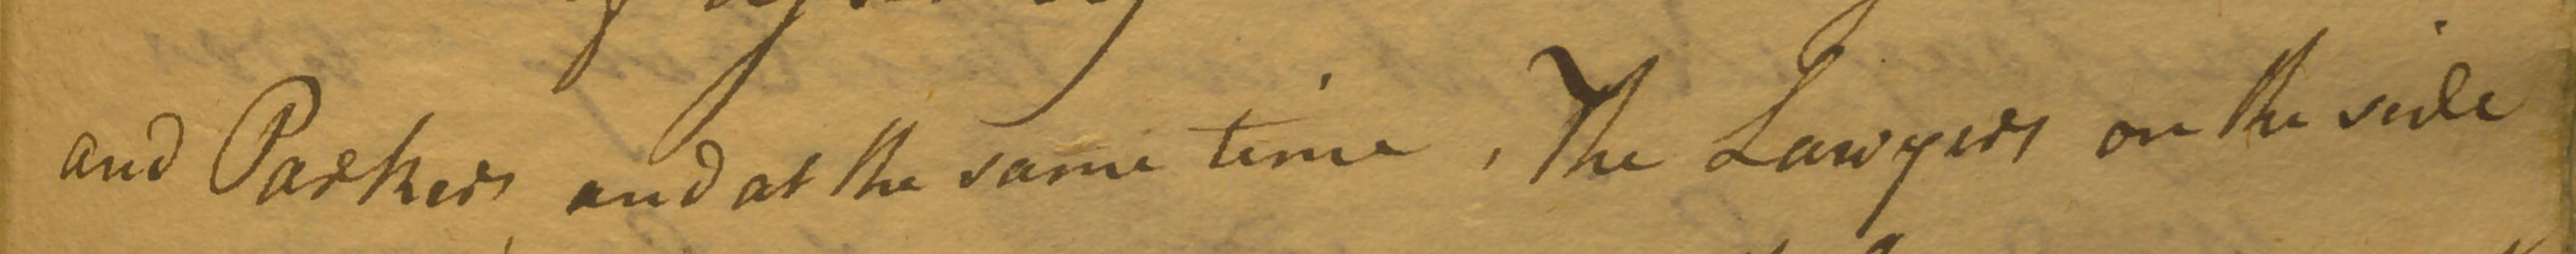and Parkers and at the same time, The Lawyers on the side
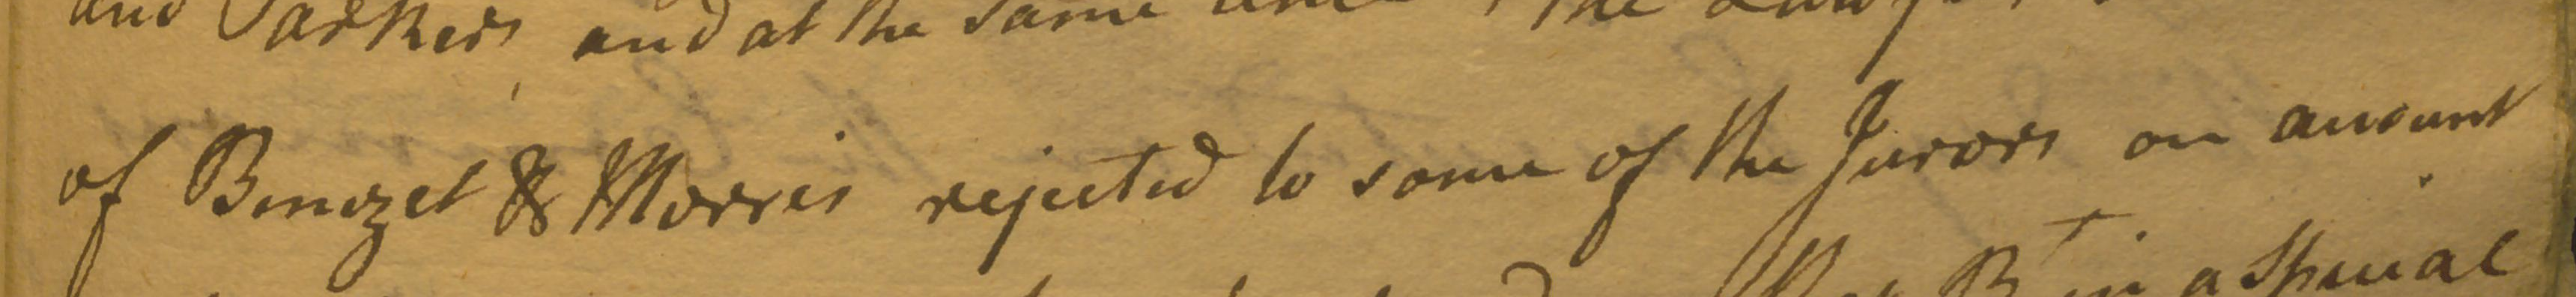of Benezet & Morris rejected to some of the Jurors on account
